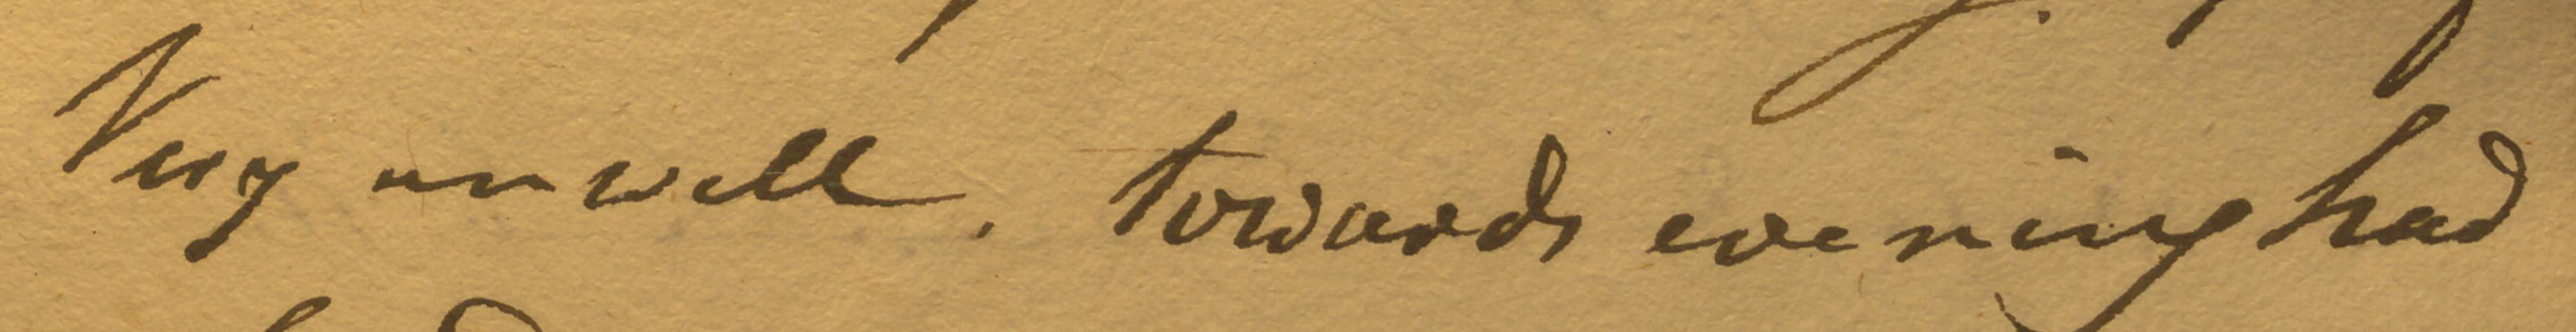Vesy unwell, towards evening had
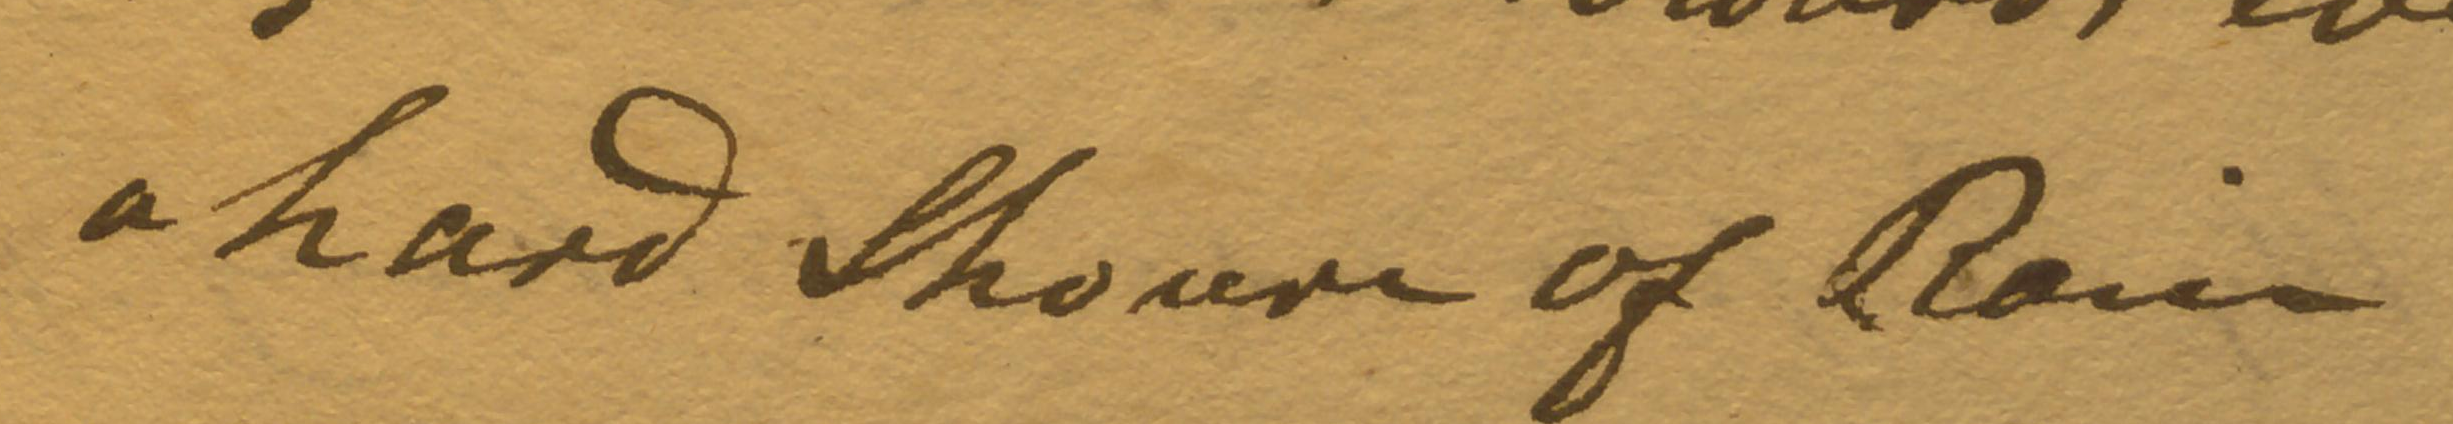a hard Shoure of Rarn
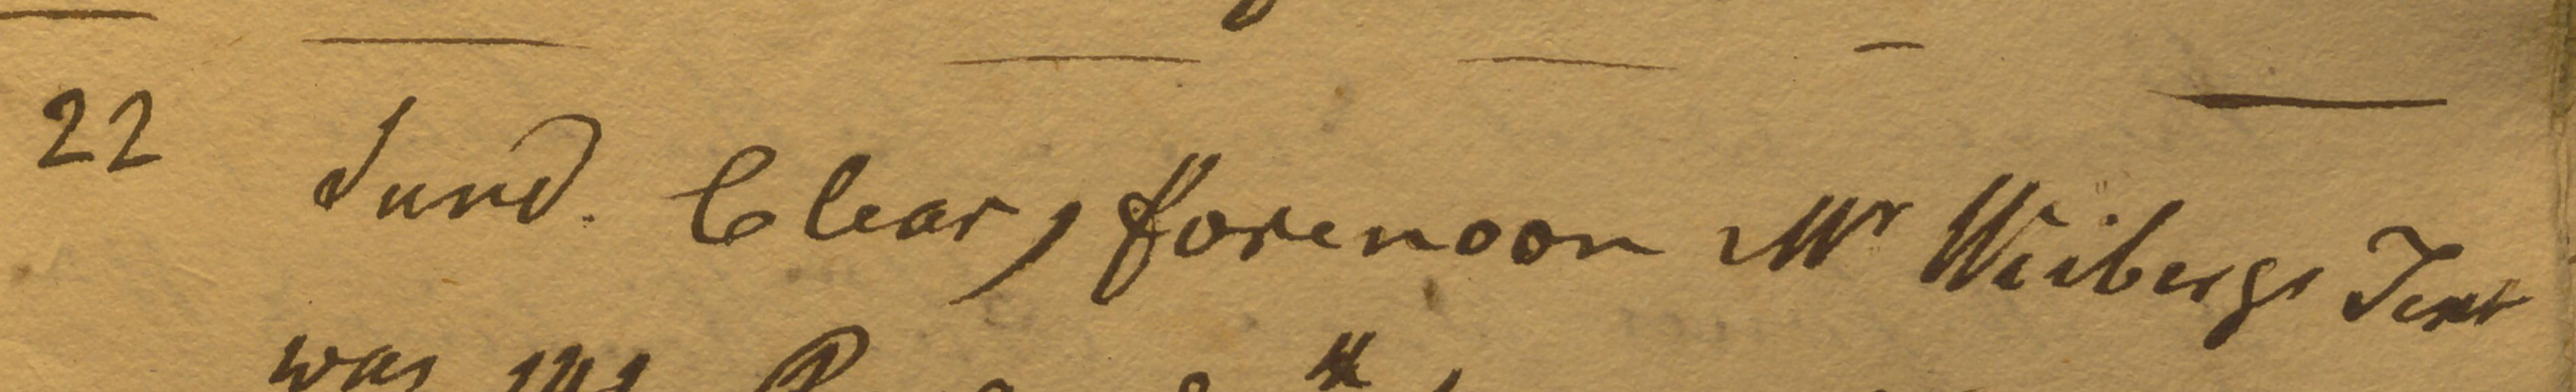22 Sund. Clear, forenoon M^r. Weibergs Text
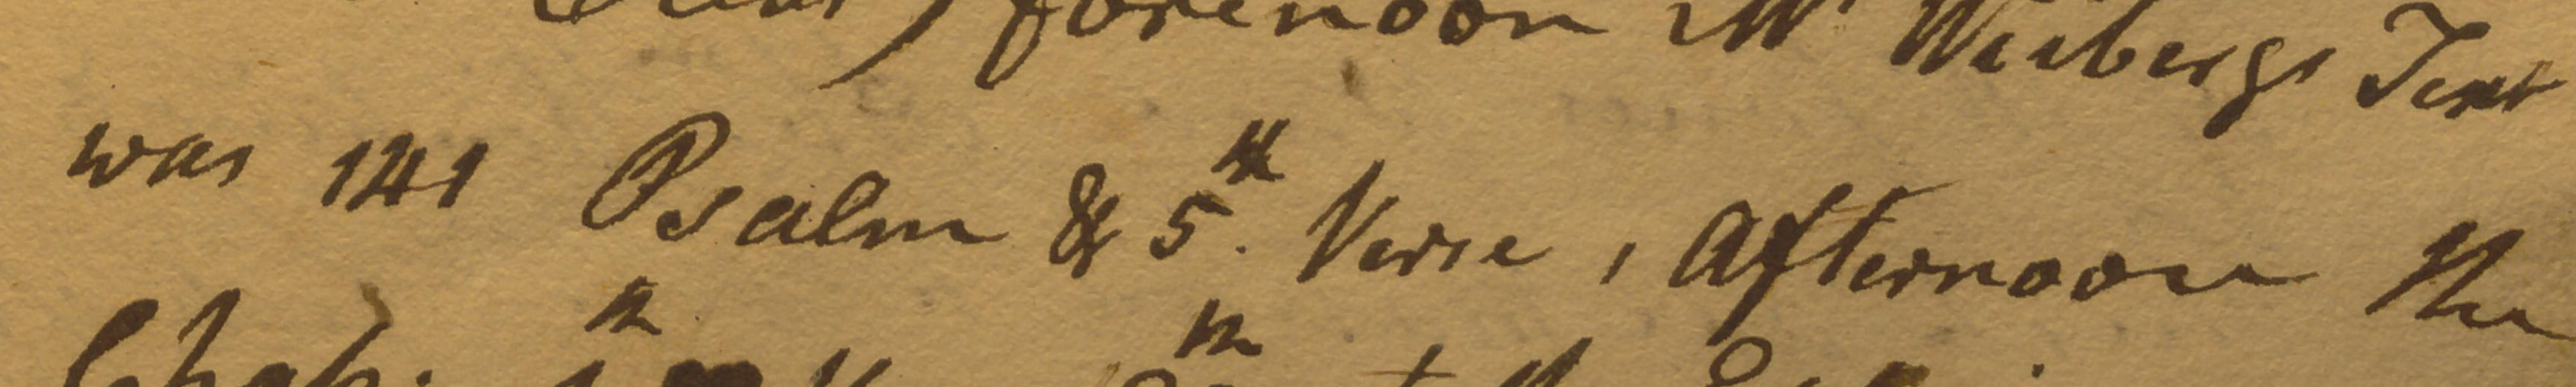was 141 Psalm & 5^th. Verse, Afternoon the
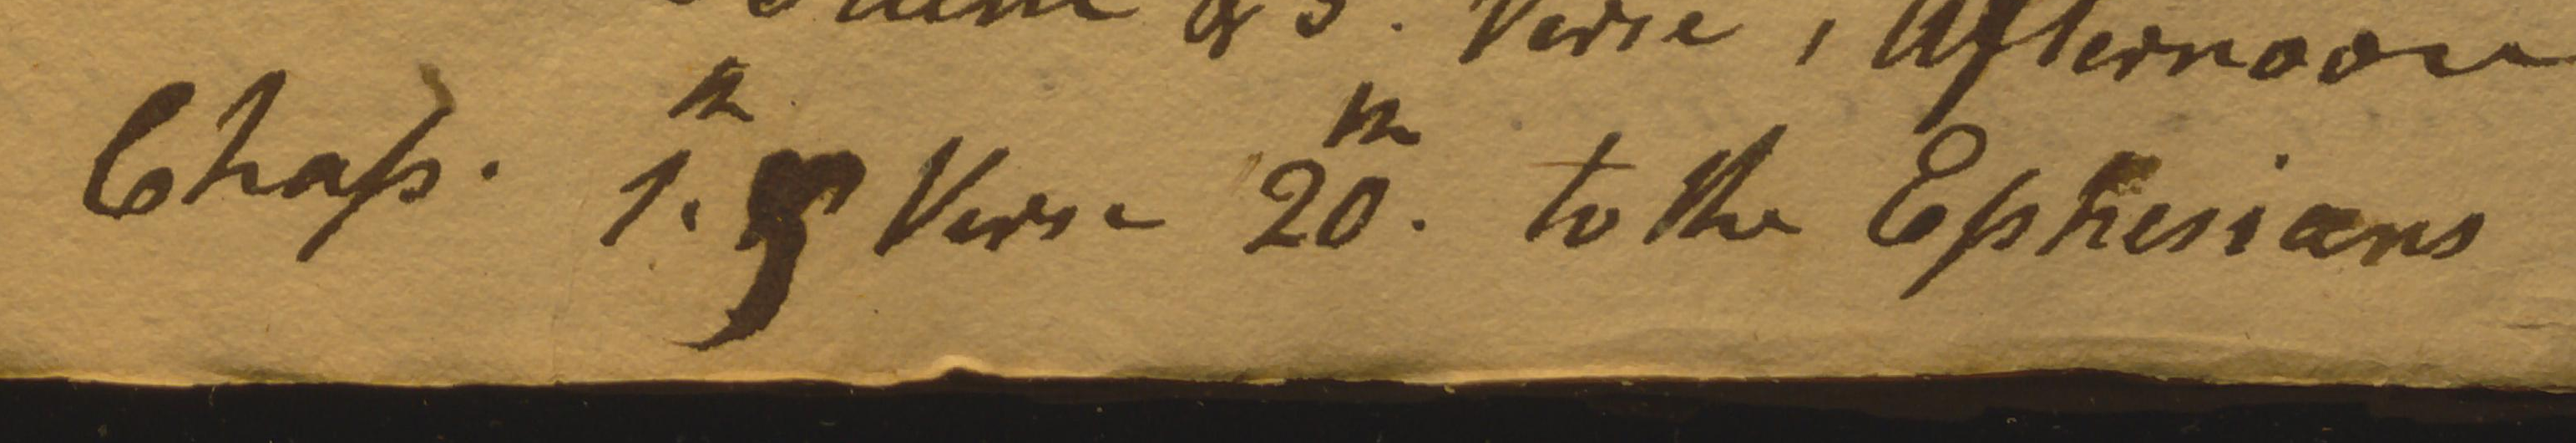Chap. 1^th. Verse 20^th. to the Ephesians
